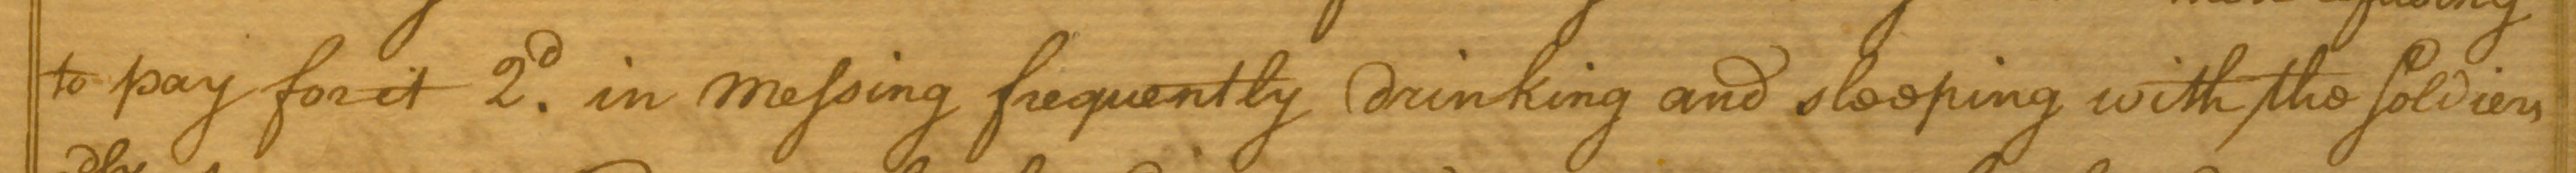to pay for it 2^d. in messing frequently drinking and sleeping with the soldiers
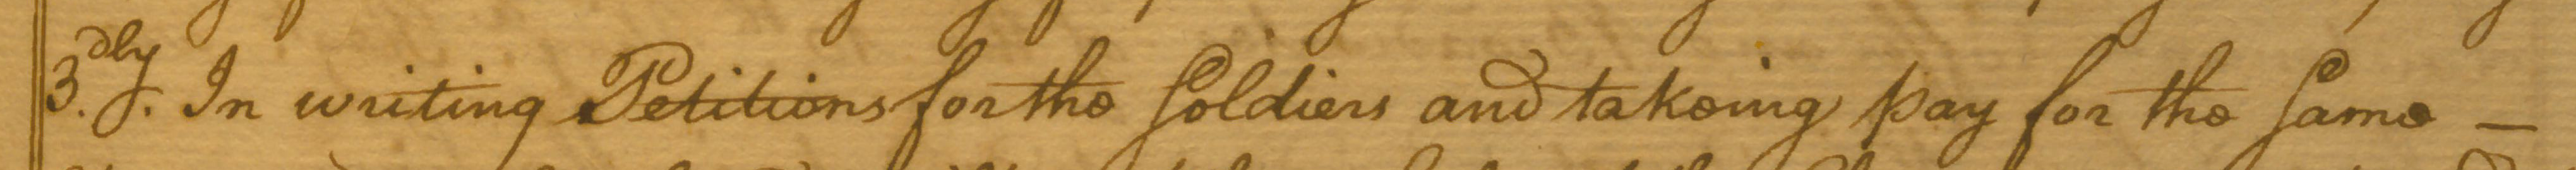3^dly. In writing Petitions for the soldiers and takeing pay for the same-
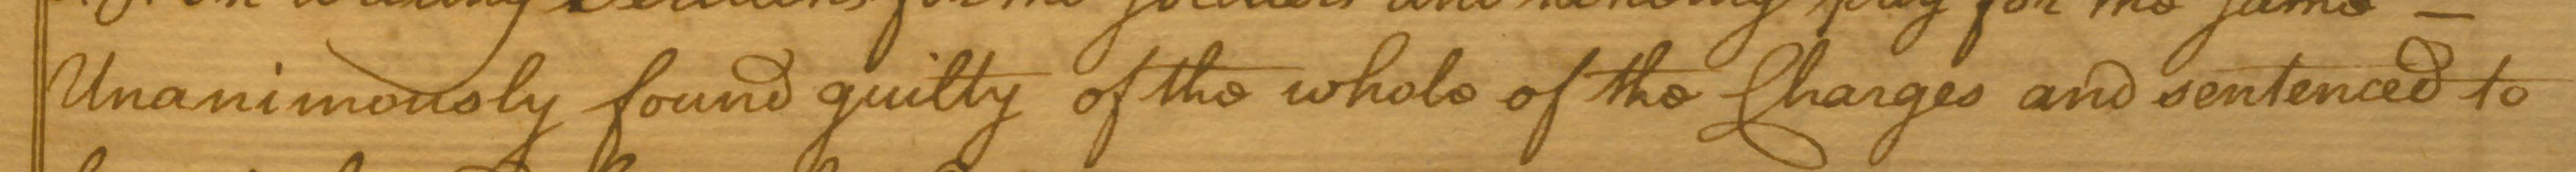Unanimously found guilty of the whole of the Charges and sentenced to
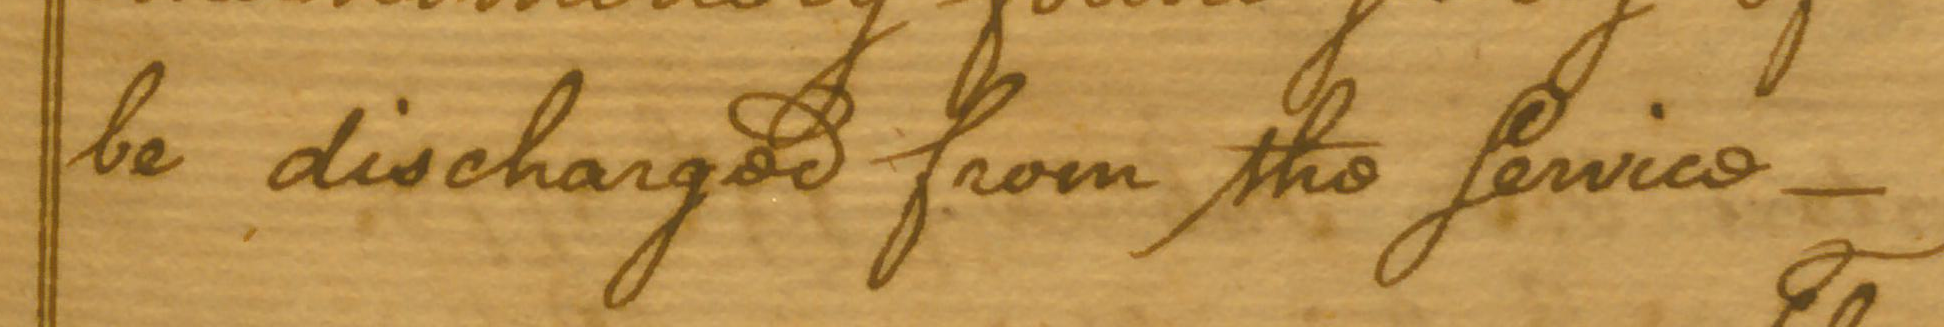be discharged from the service-
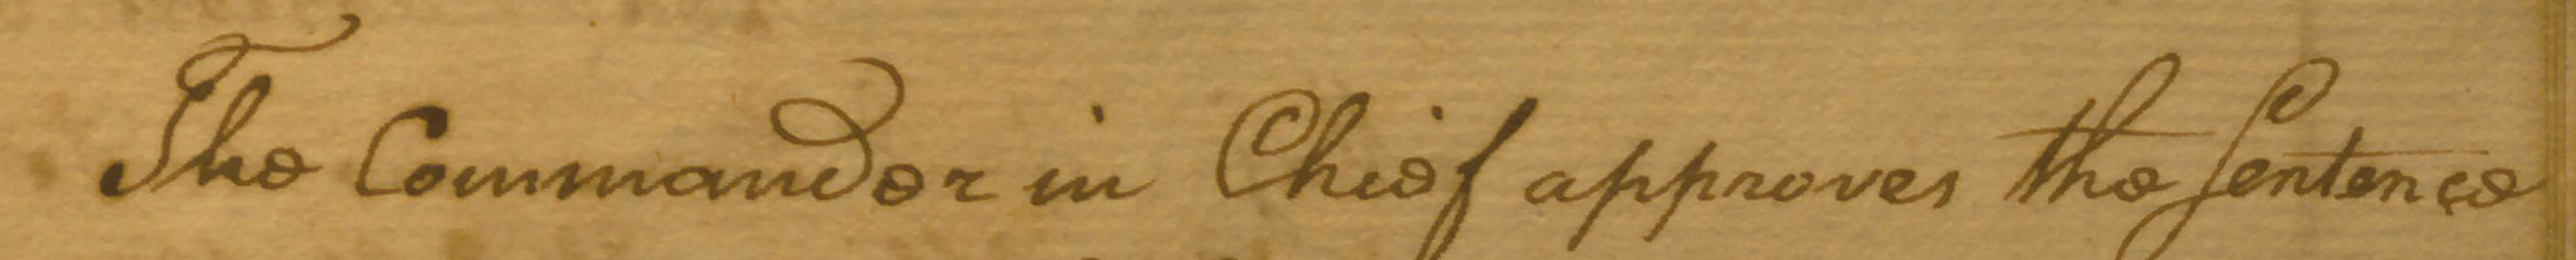The Commander in Chief approves the sentence
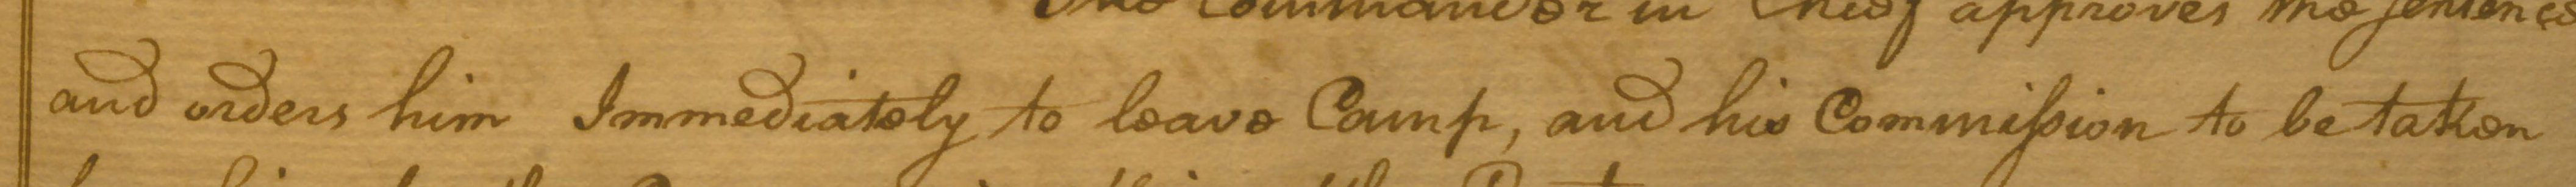and orders him Immediately to leave Camp, and his Commission to be taken
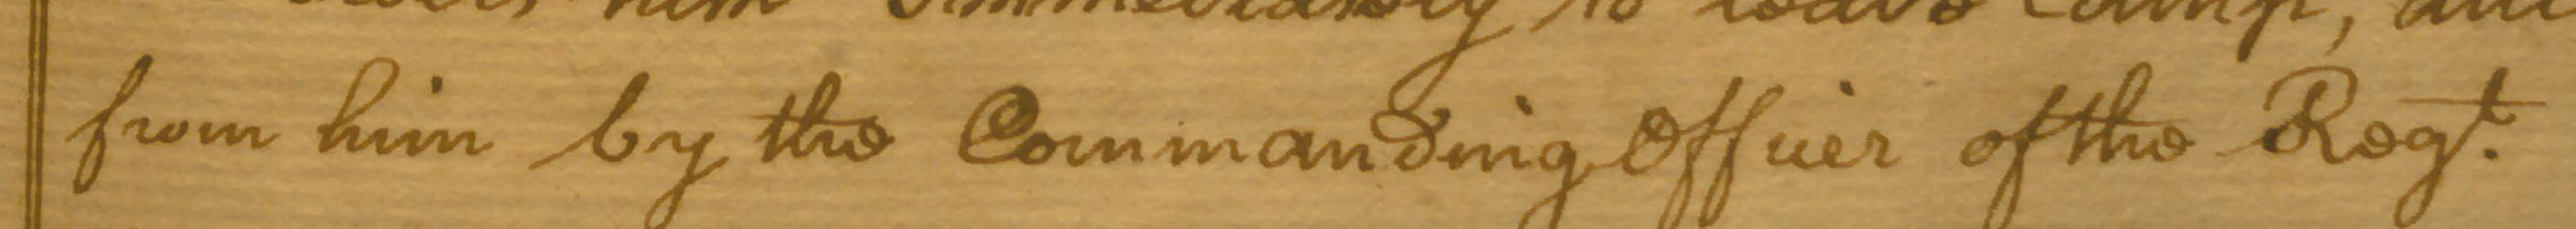from him by the Commanding officer of the Reg^t.
